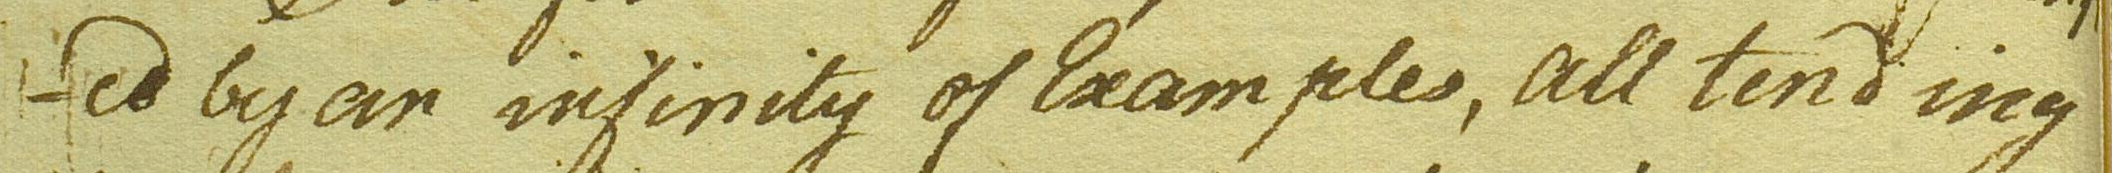-ed by an infinity of Examples, all tending
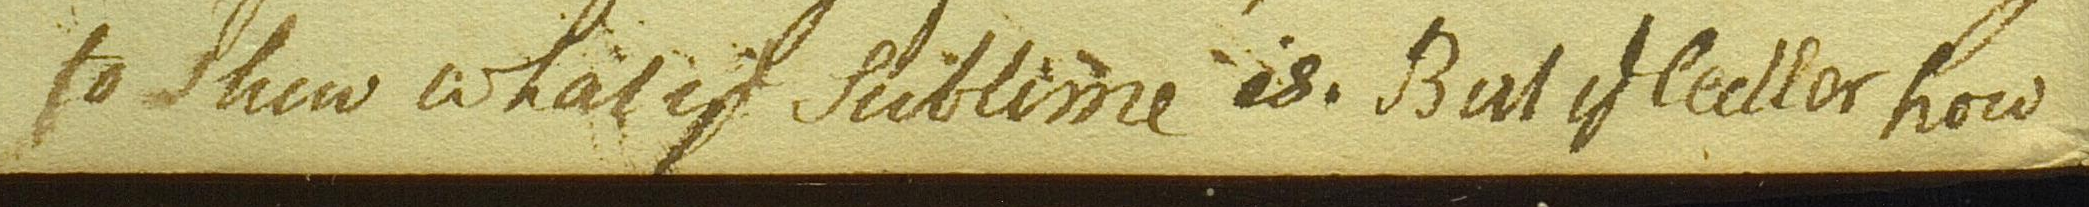to shew what y^e Sublime is. But y^e Cellar how
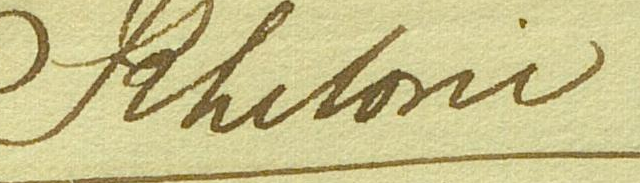Rhetoric
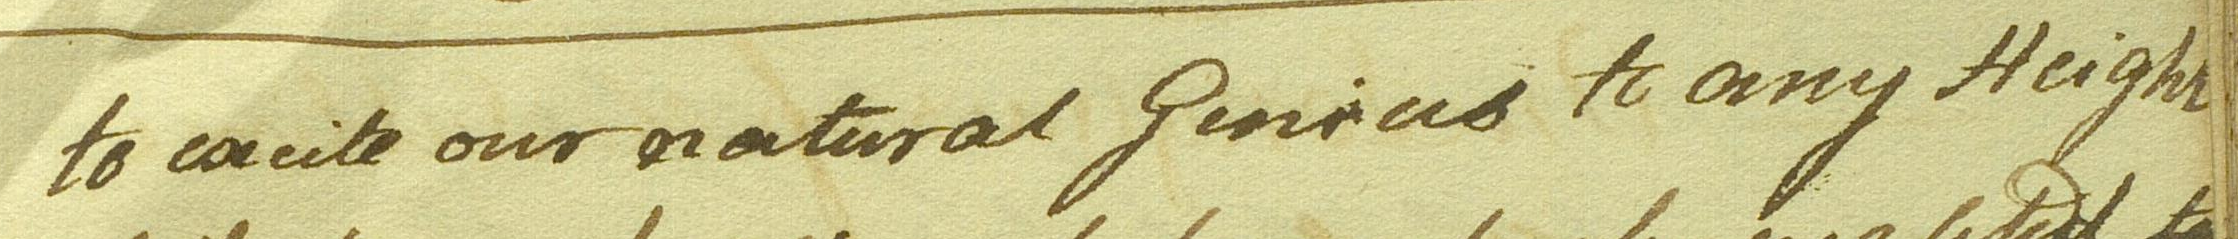to excite our natural Genius to any Height
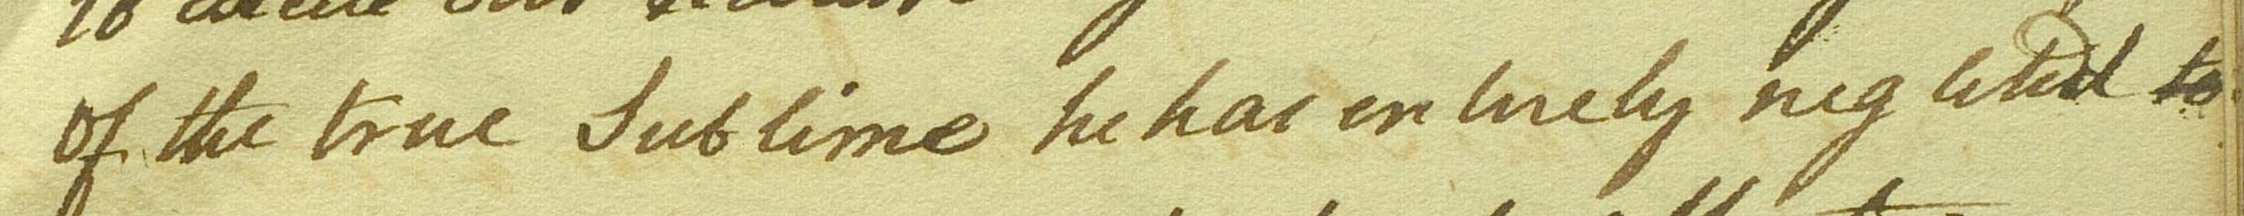of the true Sublime he has entirely neglected to
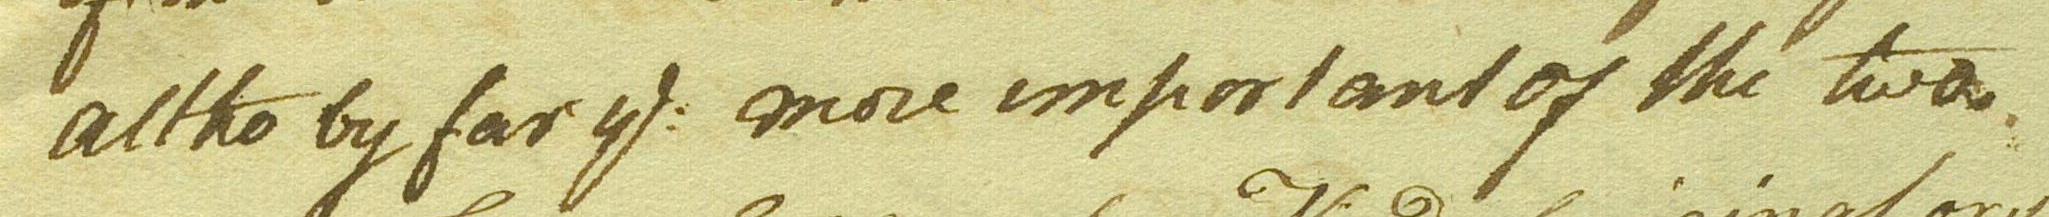altho by far y^e: more important of the two.
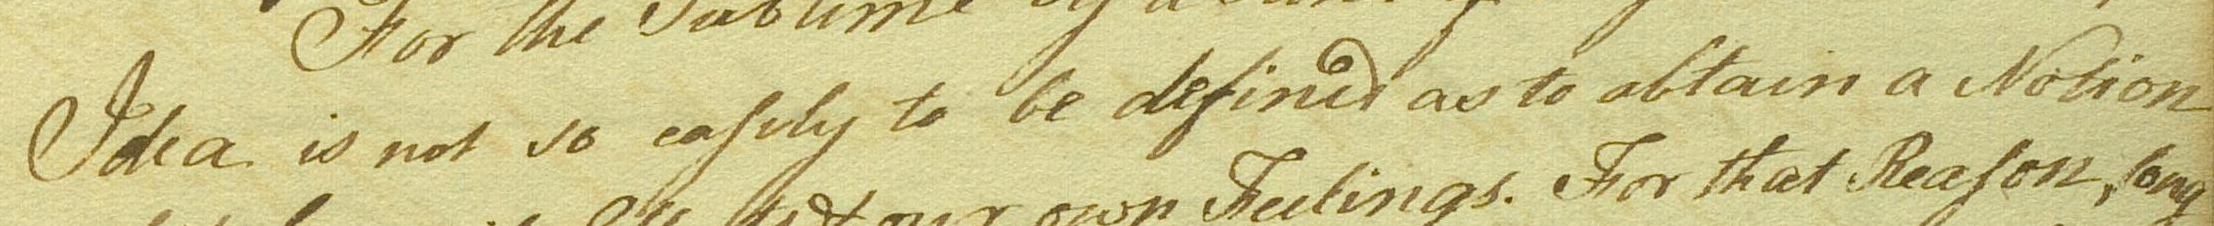Idea is not so easily to be defined as to obtain a Notion
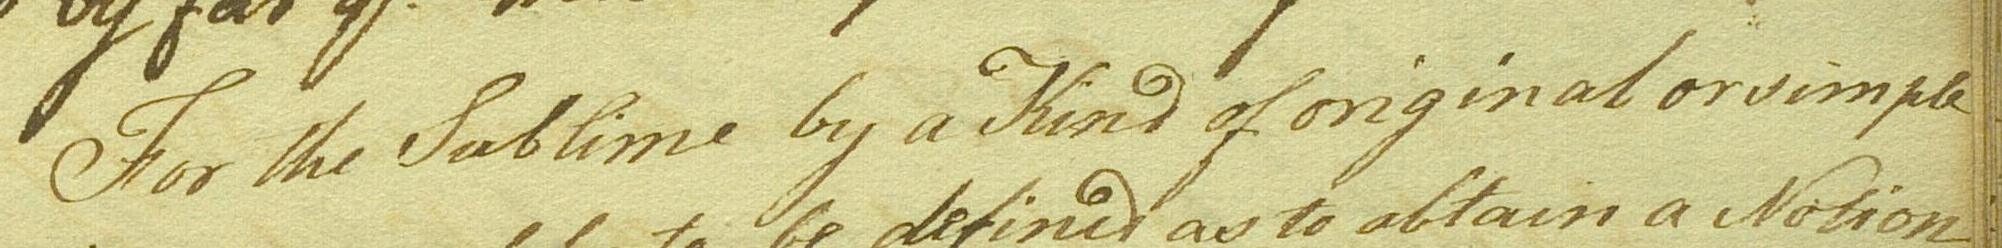For the Sublime by a Kind of original or simple
